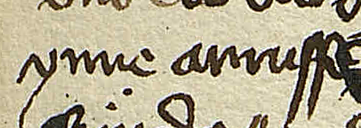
ynne anruffe*
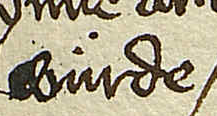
würde
